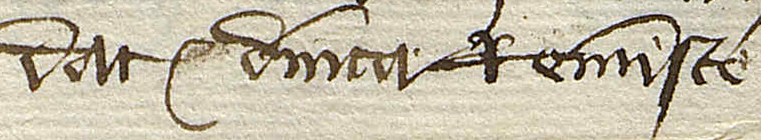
Dat* dni*ca Remi*ſce*
